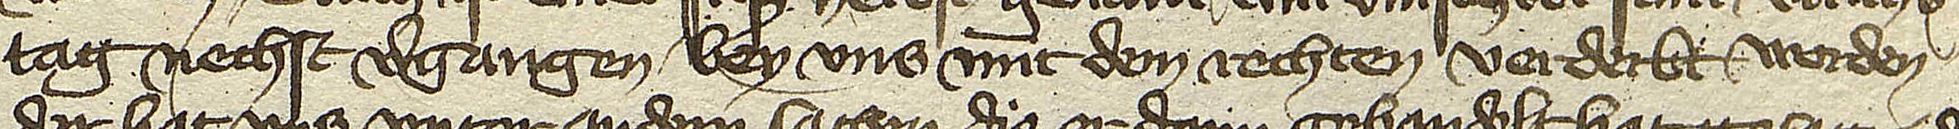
tag nechſt v*gangen / bey vns mit dem rechten verderbt worden
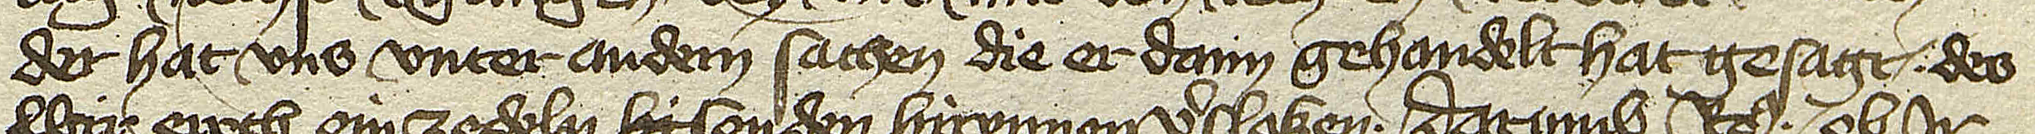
der hat vns vnter andern ſachen die er dann gehandelt hat geſagt /. des
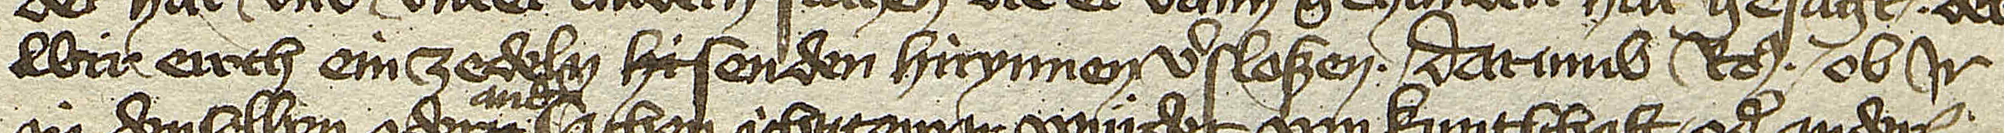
wir ewch ein cʒedeln* hi ſenden hirynnen v*ſloſʒen . / darumb Ro* . / ob Ir
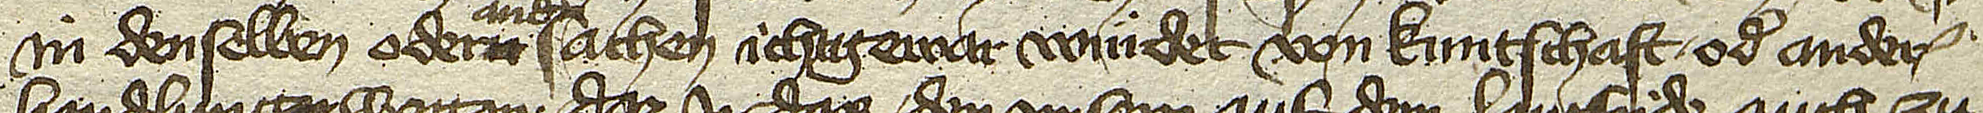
in denſelben odern ſachen ichtgewar würdet von kuntſchaft / od* ander*
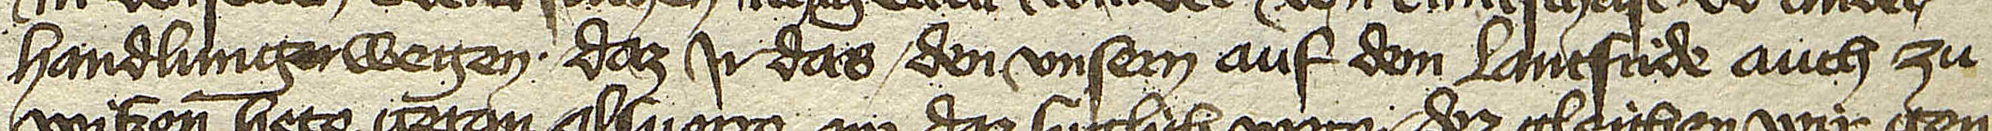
handlunge wegen . / daʒ Ir das / den vnſern auf dem Lantfride auch cʒu
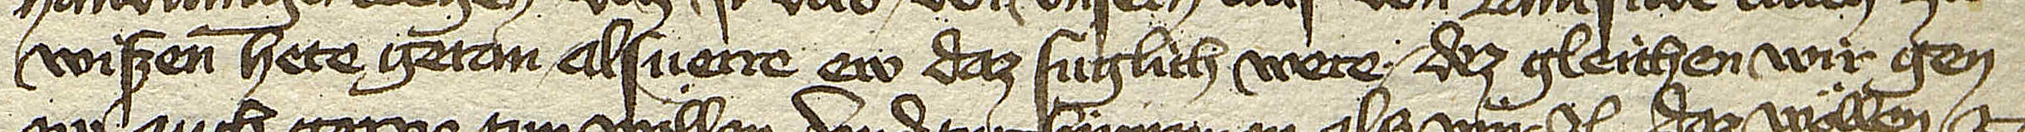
wiſʒen hete getan / alſuerre ew daʒ füglich were . / deʒ gleichen wir gen
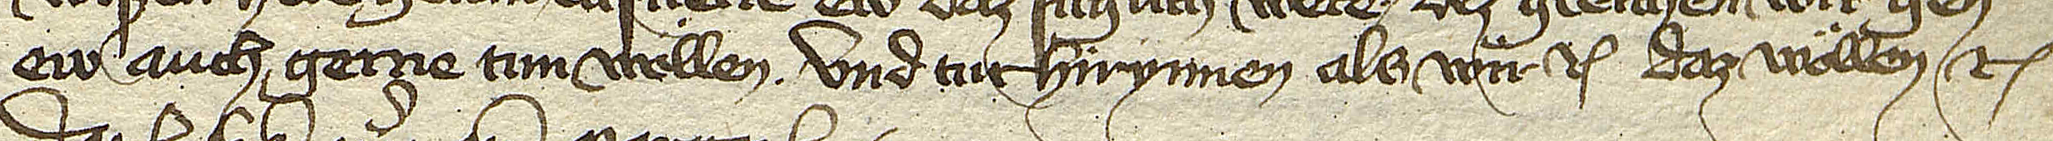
ew auch gerne tun wöllen . / Vnd tun hirynnen als wir ec* daʒ wöllen ec*
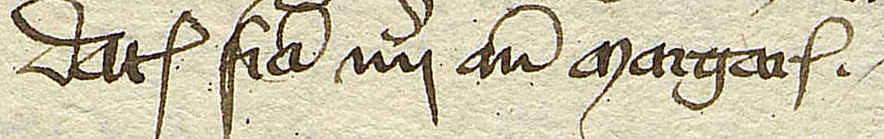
Dat* fia* iiii* an* Margar* . /
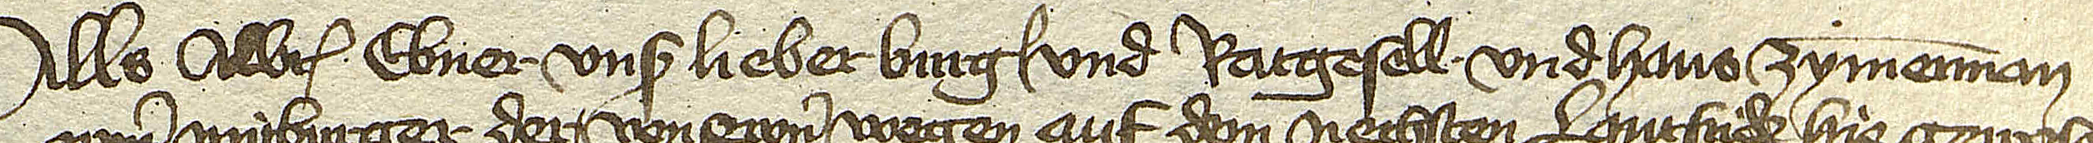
Alls Albr* Ebner vnſ* lieber burg* vnd Ratgeſell vnd hans ʒym*erman
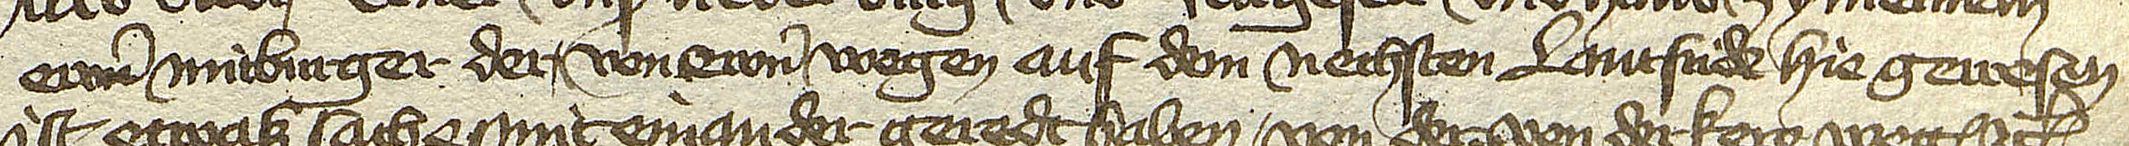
ewn* mitburger der von ewn* wegen auf dem nechſten Lantfride hie geweſen
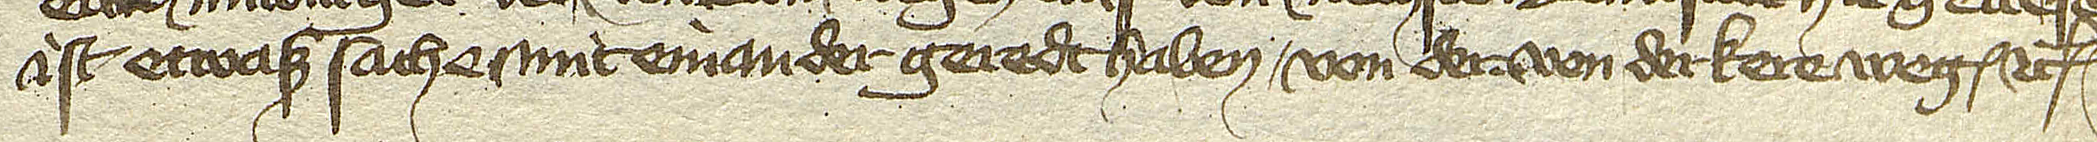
iſt etwaſʒ ſache mit einander geredt haben / von der ~ von der kere weg* ec*
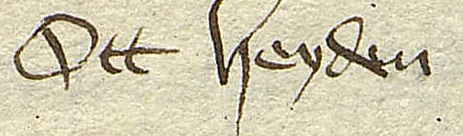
Ott Heyden
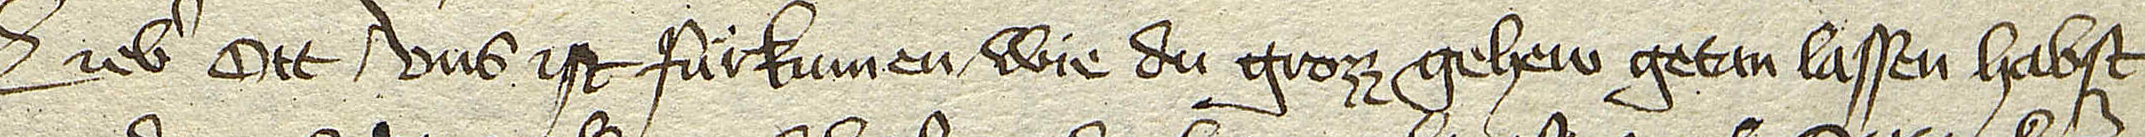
Lieb* Ott / Vns iſt fürkumen / wie du groʒʒ gehew getan laſſen habſt
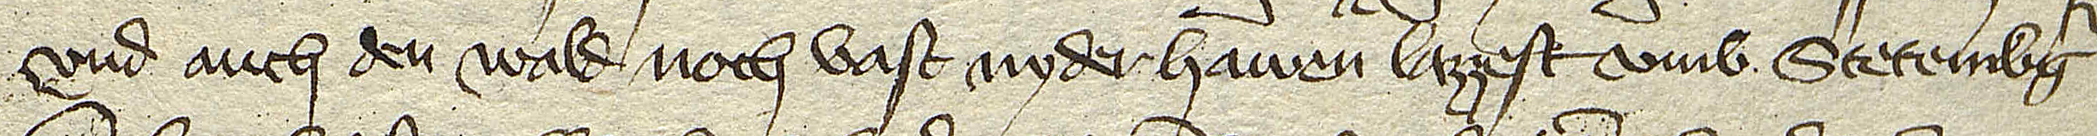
vnd auch den wald noch vaſt nyder hawen laʒʒeſt vmb Stetembg*
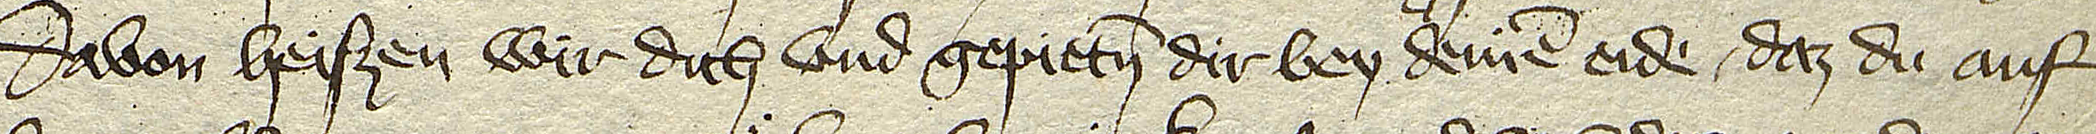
Davon heiſʒen wir dich vnd gepietn* dir bey deine* eide / daʒ du auf
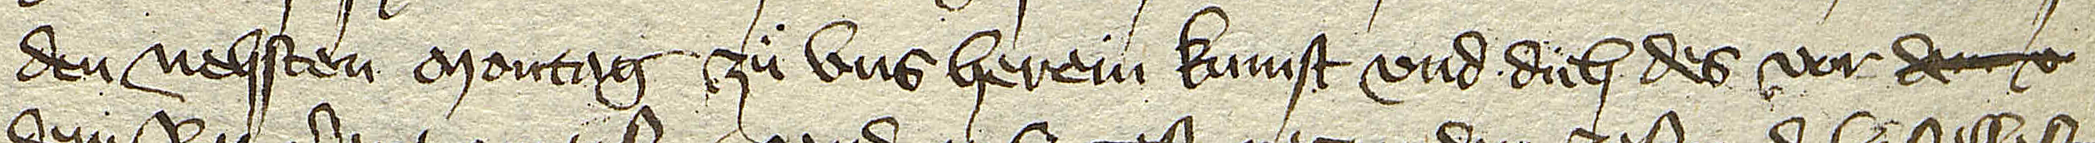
den nehſten Montag cʒü vns herein kumſt vnd dich des vor dem v
